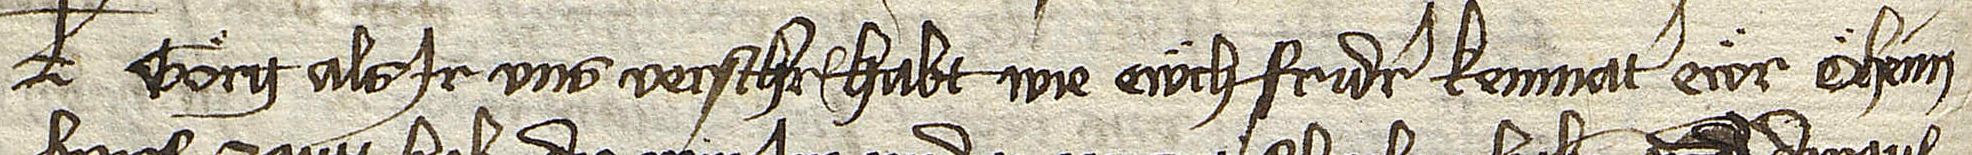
L* Görg als Ir vns verſchr* habt wie eẅch fridr* Kemnat* eẅr Öheim
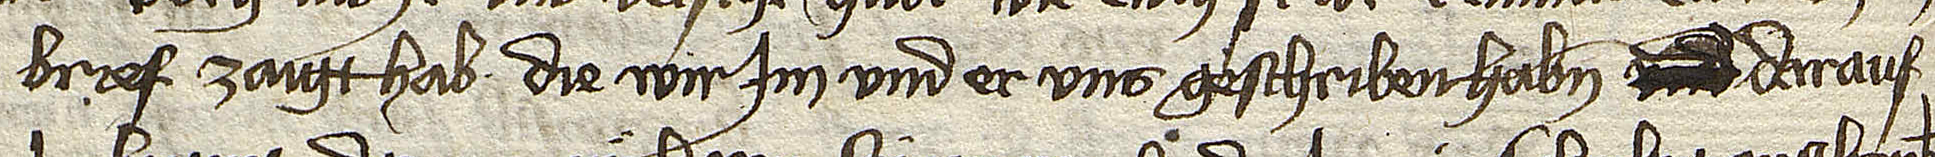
brief ʒaigt hab . die wir Im vns er vns geſchriben habn* vnd darauf
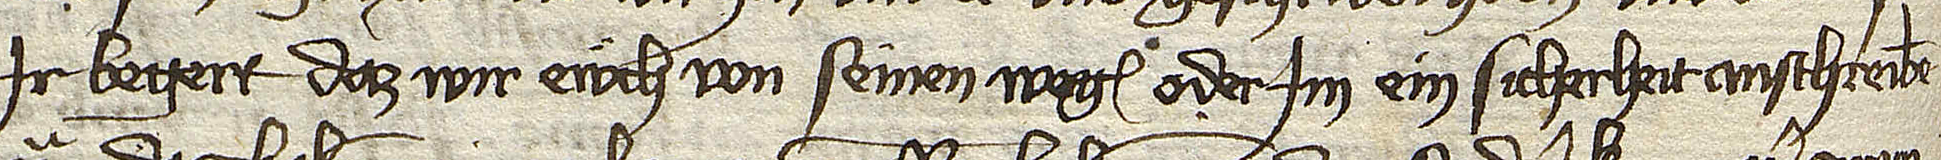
Ir begert daʒ wir eẅch von ſeinen weg* oder Im ein ſicherheit anſchreibe*
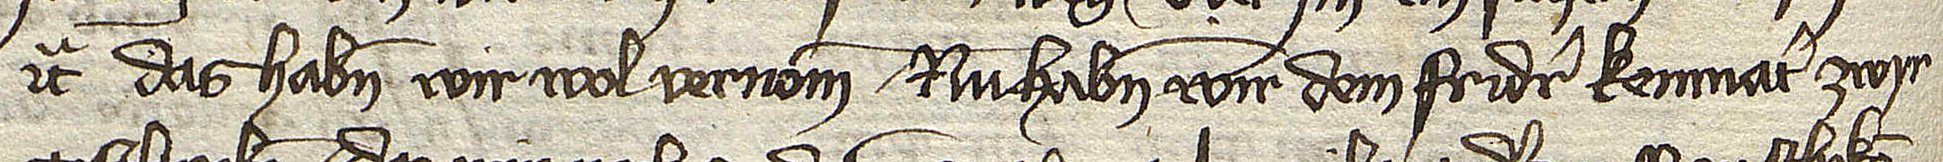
ec* das habn* wir wol vernom* / Nu habn* wir dem fridr* kemnat* ʒwyr
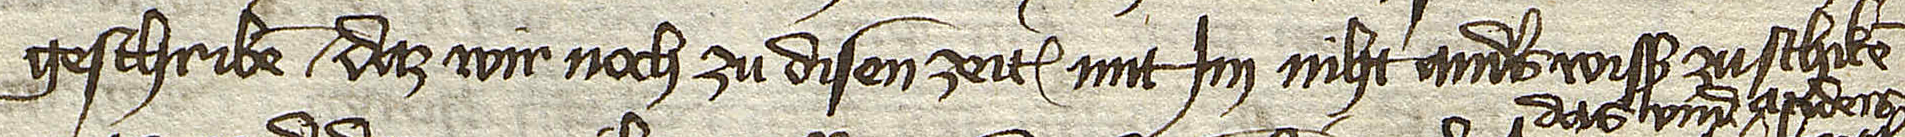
geſchribe* / Daʒ wir noch ʒu diſen ʒeit* mit Im niht and*s wiſſ* ʒu ſchike*
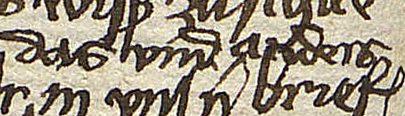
das vnd anders
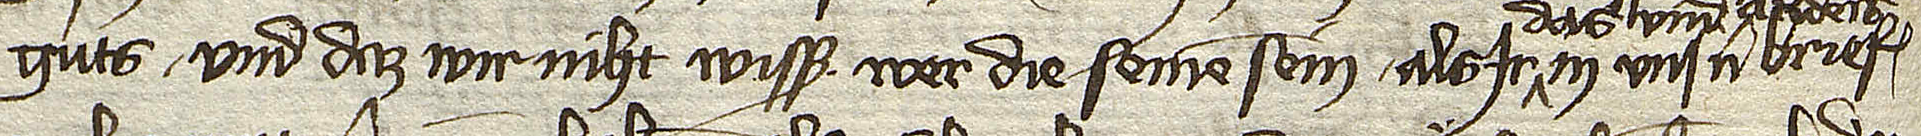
guts / vnd daʒ wir niht wiſſ* . wer die ſeine* ſein / als Ir in vnſn* brief*
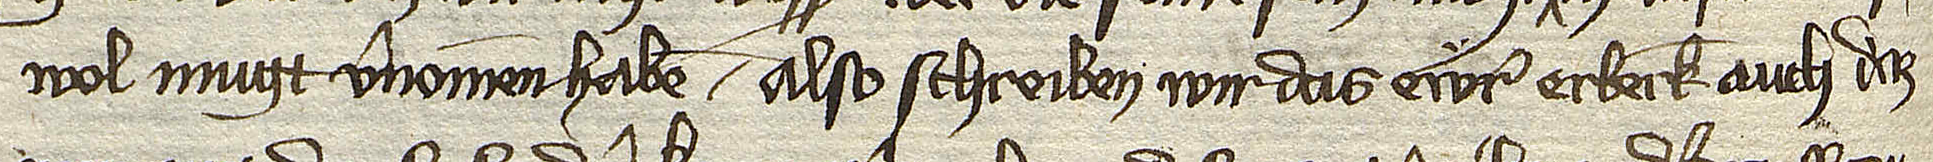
wol mugt v*nom*en habe* / alſo ſchreiben wir das eẅr* erberk* auch daʒ
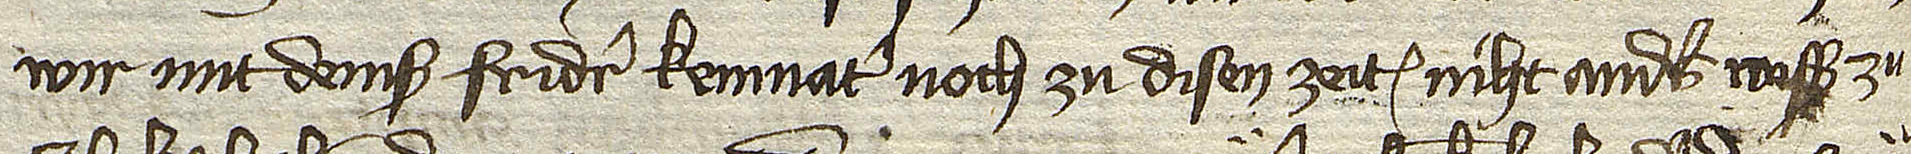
wir mit demſ* fridr* kemnat* noch ʒu diſen ʒeit* niht and*s wiſſ* ʒu
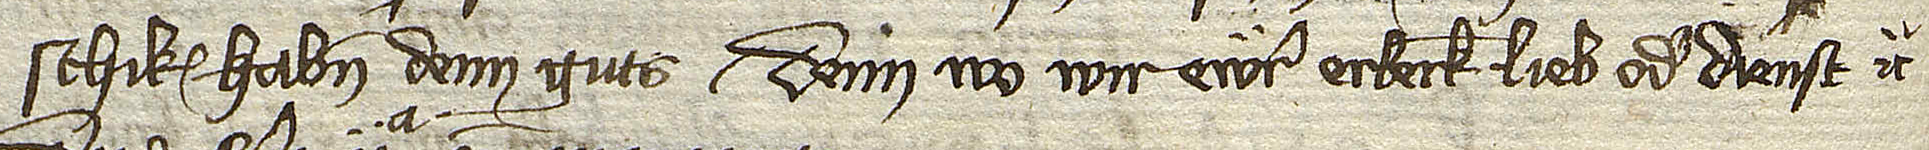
ſchik* habn* denn guts / Denn wo wir eẅr* erberk* lieb od* dienſt ec*
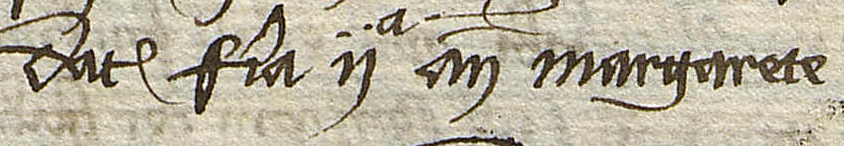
Dat* fi*a ii* an* margarete
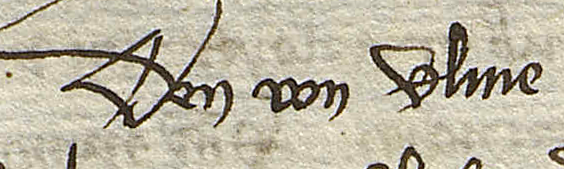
Den von Vlme
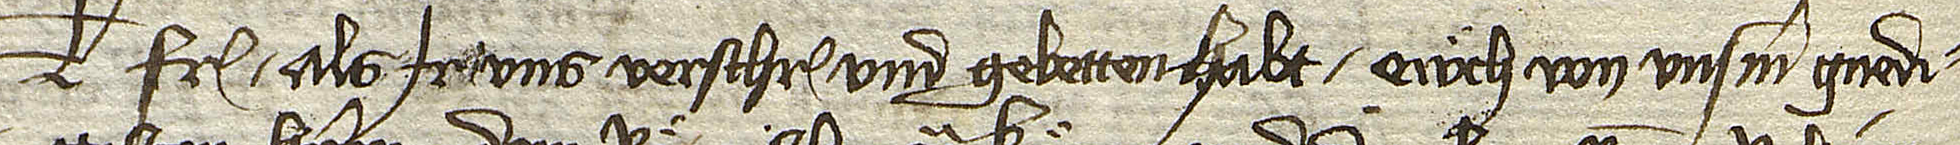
L* fr* / als Ir vns verſchr* vnd gebetten habt / eẅch von vnſm* gnedi =
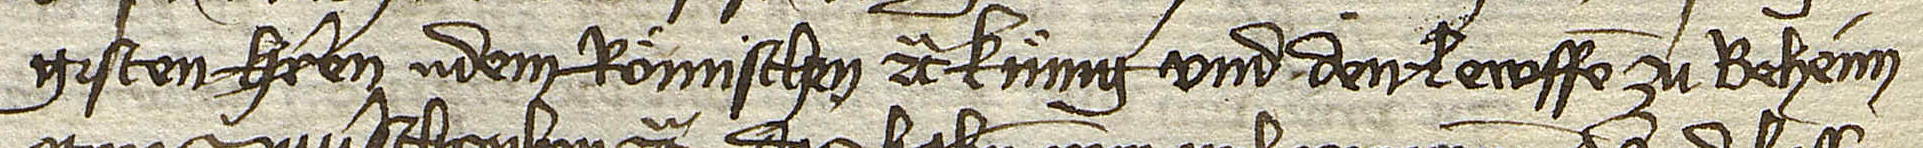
giſten h*ren ~ dem Römiſchen ec* künig vnd den lewffe* ʒu Beheim
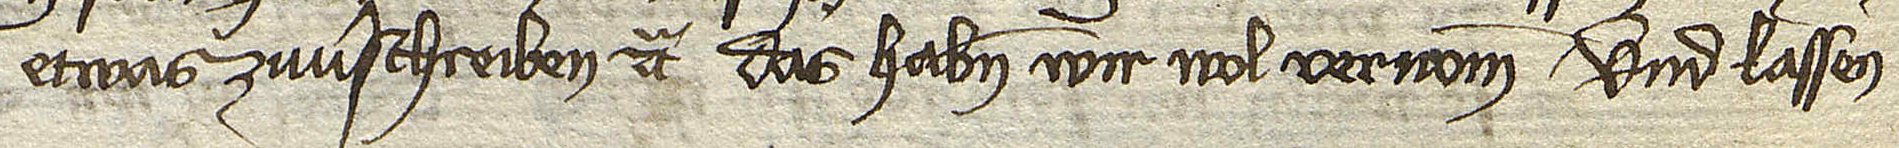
etwas ʒuu*ſchreiben ec* Das habn* wir wol vernom* / Vnd laſſen
